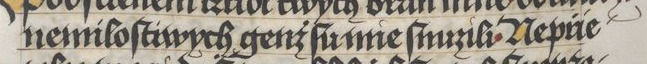nemiloſtiwych genż ſu mie ſnuzili.Nepṙie¬
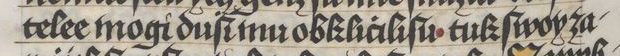telee mogi duẛi mu obkliċiliſu.tuk ſwoy za¬
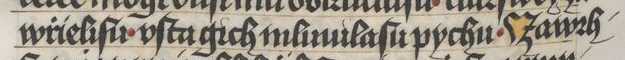wṙíeliſu.uſta gich mluwilaſu pychu.Zawrh¬
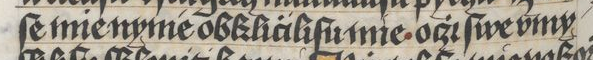ſe mie nunie obkliċili u mie.ocżi ſwe viny
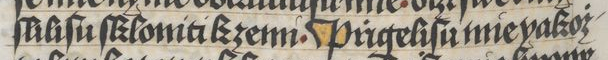ſliliſu ſkloniti k zemi.Pṙigeliſu mie yakoż¬
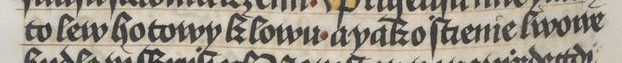to lew hotowy k lowu.a yako ẛtienie lwowe
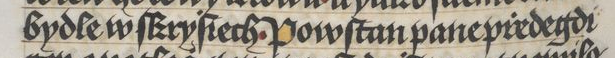bydle w ſkryẛiech.Powſtan pane pṙedegdi
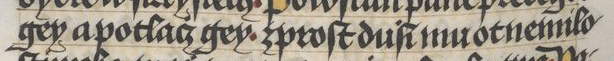gey a potlacż gey.zproſt duẛi mu ot nemilo¬
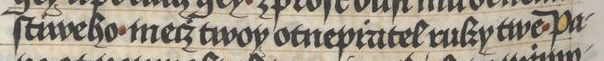ſtiweho.mecż twoy otnepṙatel ruky twe.Pa¬
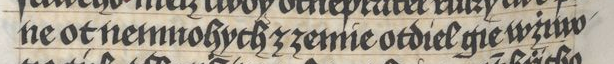ne ot nemnohych z zemie otdiel gie wżiwo¬
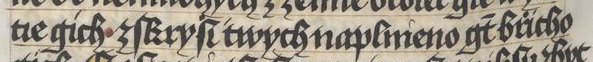tie gich.zſkryẛi twych naplnieno ḡt bṙicho
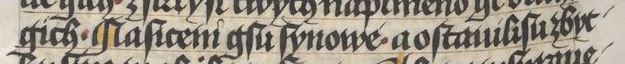gich.Naſiceni gſu ſynnowé.a ostaviliſu zbyt¬
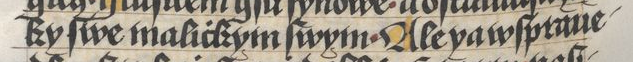ky ſwe maliċkym ſwym.Ale ya wſprave¬
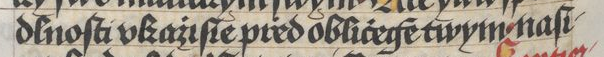dlnoſti ukażiſie pṙed obliċegē twym.naſi
